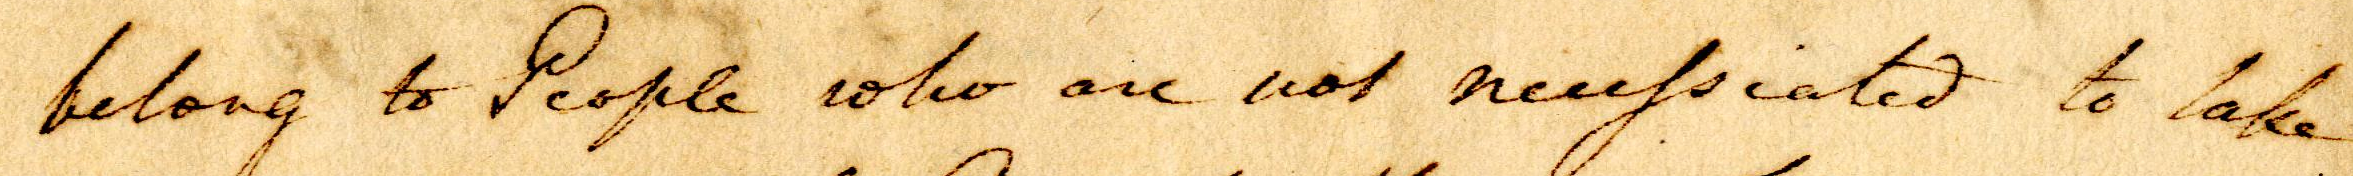belong to People who are not necessiated to take
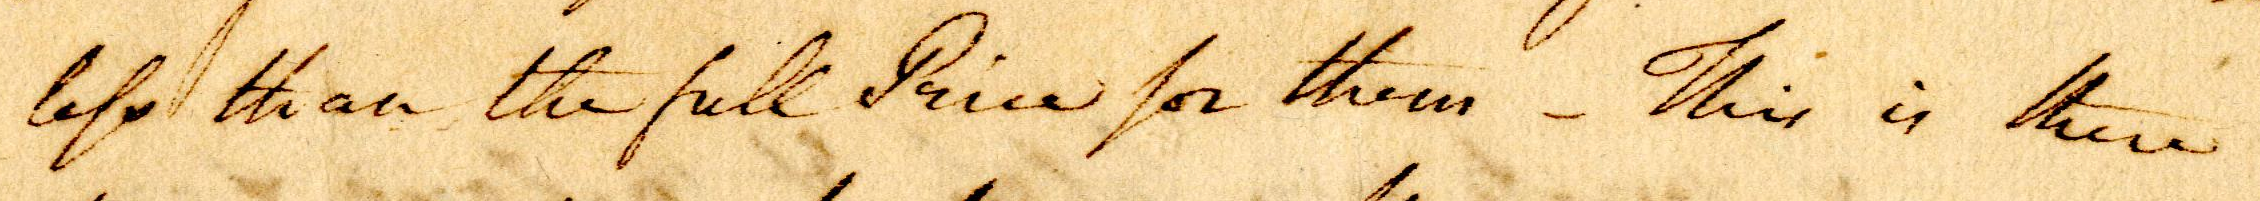less than the full Price for them. This is there-
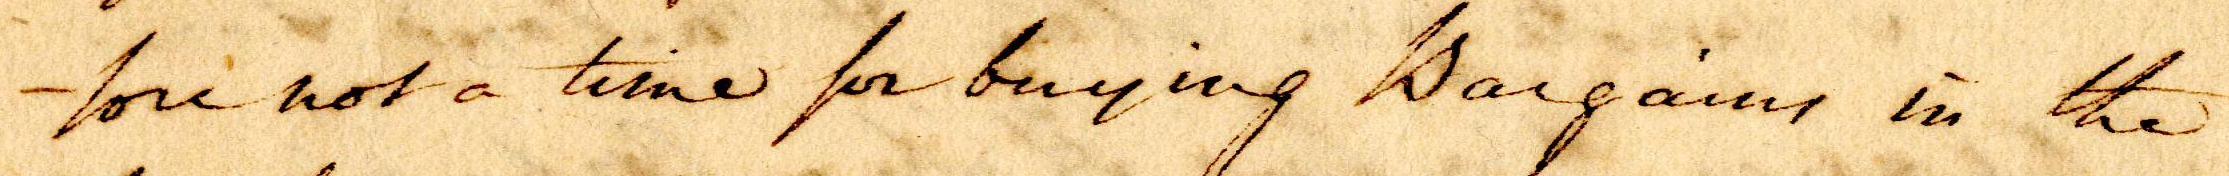-fore not a time for buying Bargains in the
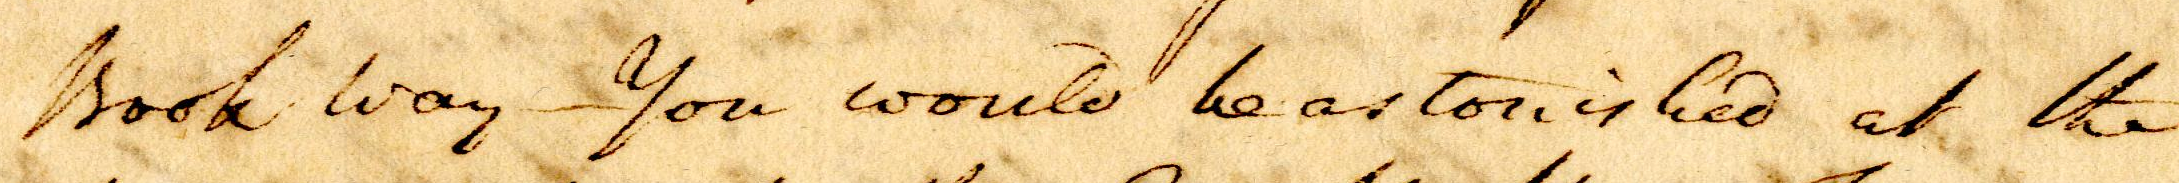Book way. You would be astonished at the
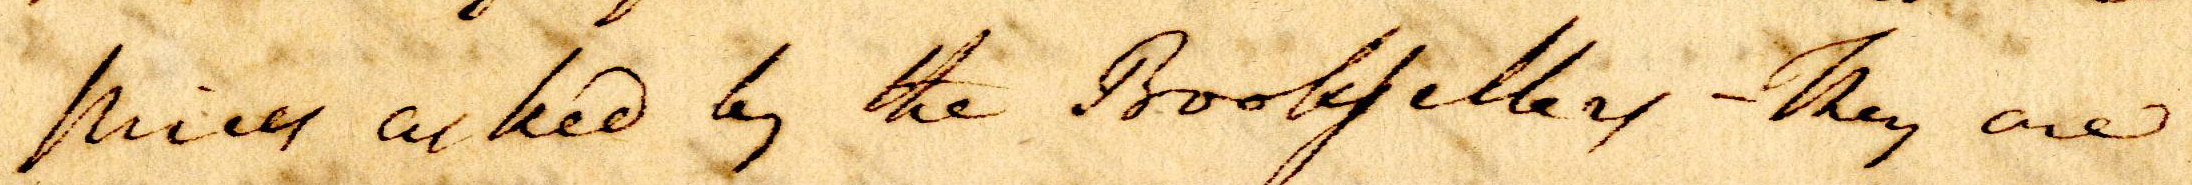prices as had by the Booksellers. They are
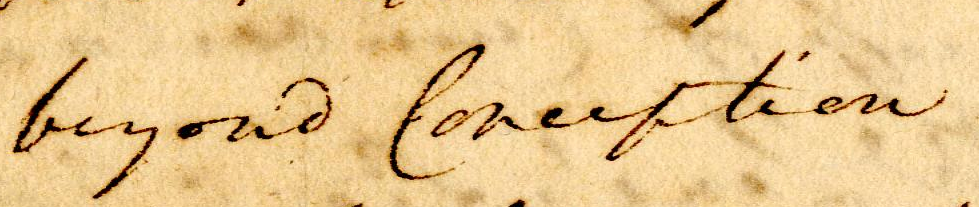beyond Conception.
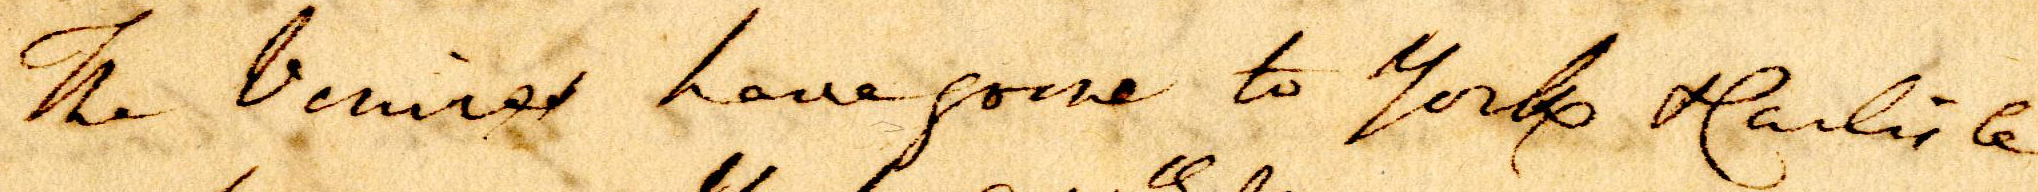The Venises have gone to York & Carlisle
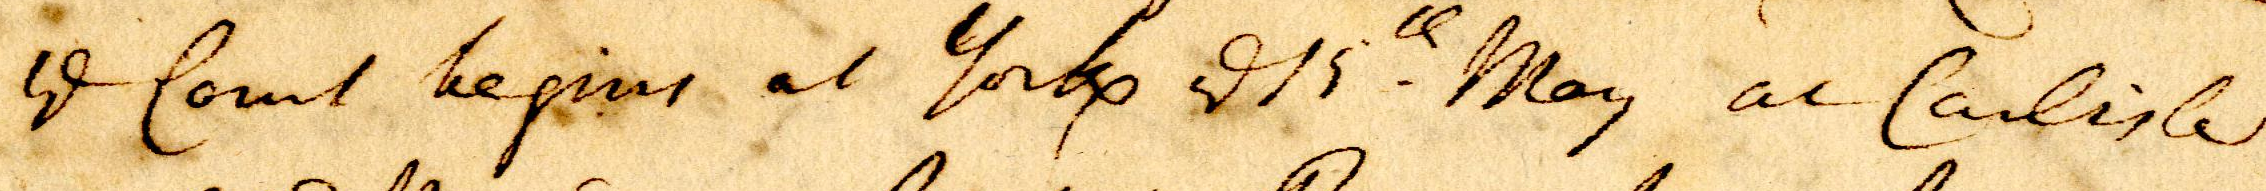y^e Court begins at York y^e 15^th May at Carlisle
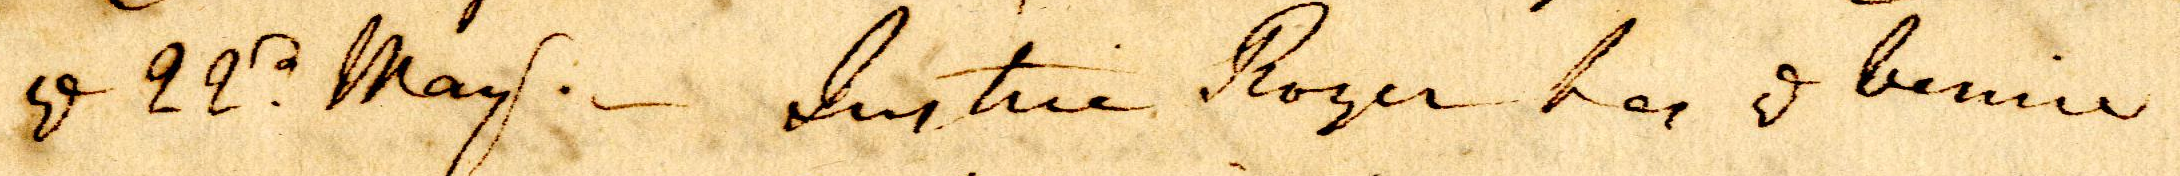y^e 22^d. May. Justice Royer has y^e Venie
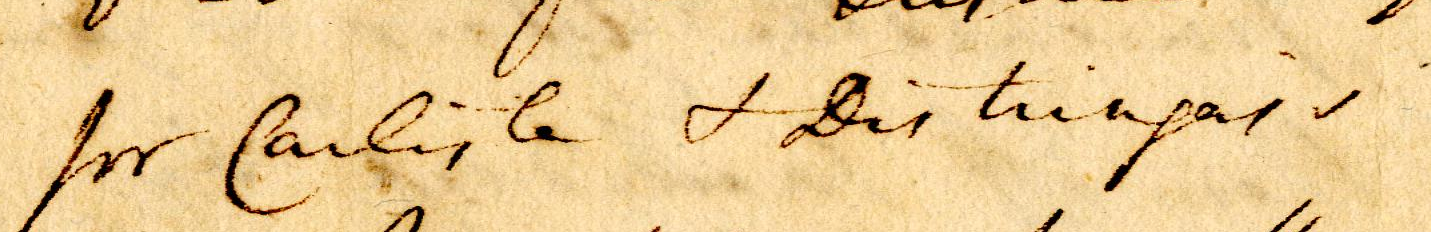for Carlisle & Distingas's
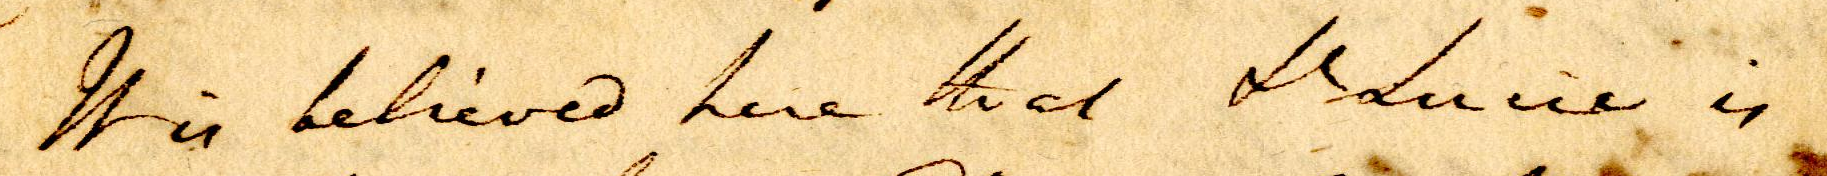It is believed here that S^t Lucia is
